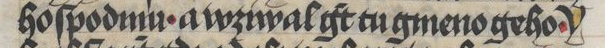ho ſpodinu.a wziwal ḡt tu gmeno geho.Y
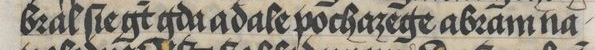bral ſie ḡt gda a dale pochazege abram na
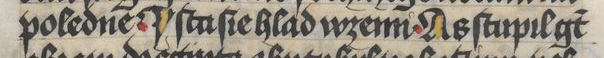poledne?Y ſta ſie hlad wzemi. A sſtupil ḡt
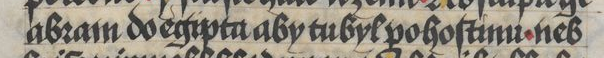abram do egipta aby tubyl pohoſtinu.neb
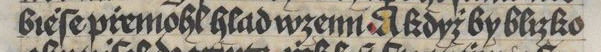bíeẛe pṙemohl hlad wzemi. A kdyż by blizko
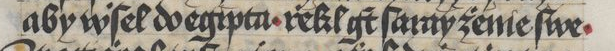aby wẛel d egipta.ṙekl ḡt ſaray żenie ſwe.
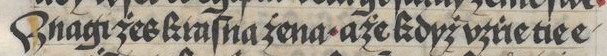Znagí żes kraſna żena.a że kdyż vzṙie tie e¬
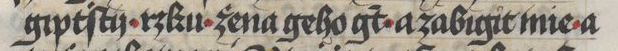giptẛtij.rzku.żena geho ḡt.a zabigit mie.a
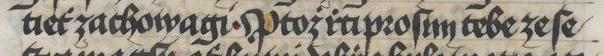tieṫ zachowagí.Ꝓtoż ṙti proſim tebe ze ſe¬
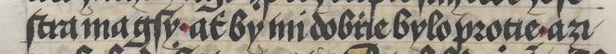ſtra ma gſy.aṫ by mi dobṙie bylo protie.a zi¬
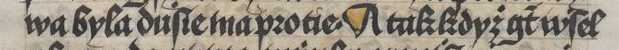wa byla duẛie ma pro tie. A tak kdyż ḡt wẛel
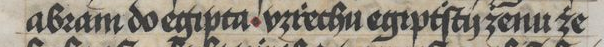abram do egipta.vzṙechu egiptẛtij żenu że
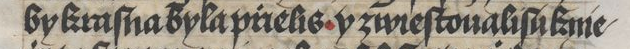by kraſna byla pṙielis.y zwieſtouali ſu kníe¬
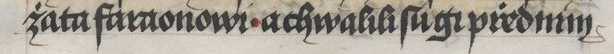żata faraonowi.a chwalili ſu gi pṙednim
